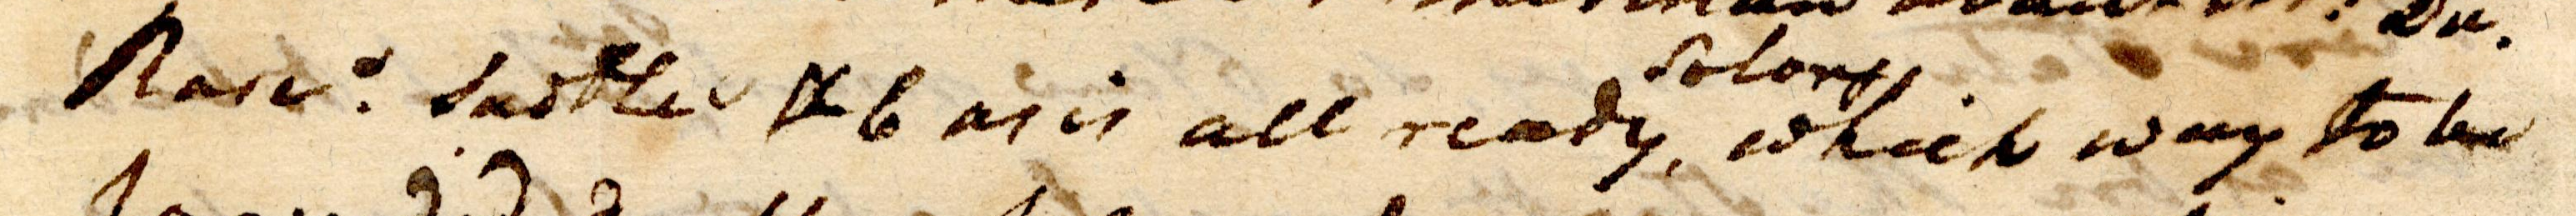-Rarc^d. Settle &C as is all ready, which way to be
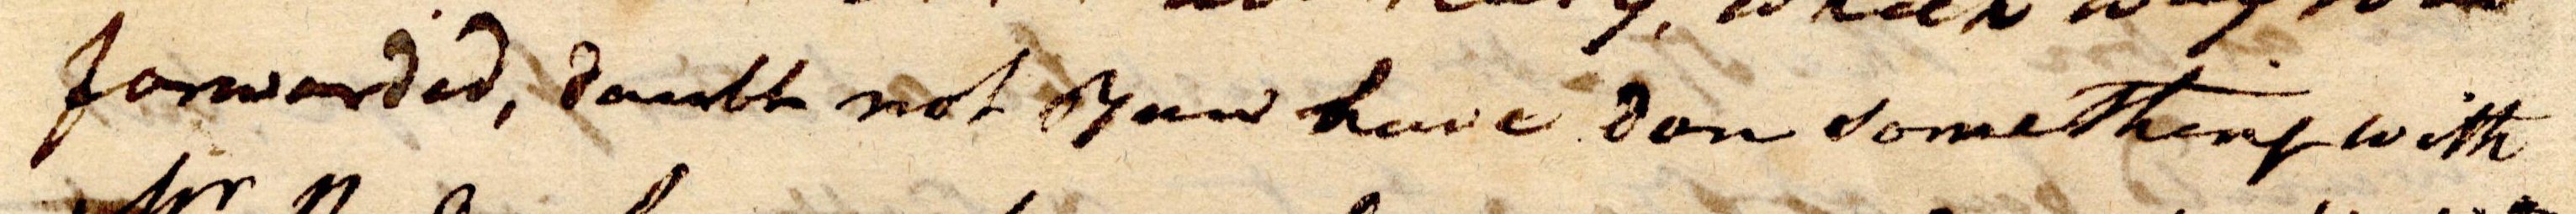forwarded, doubt not you have don something with
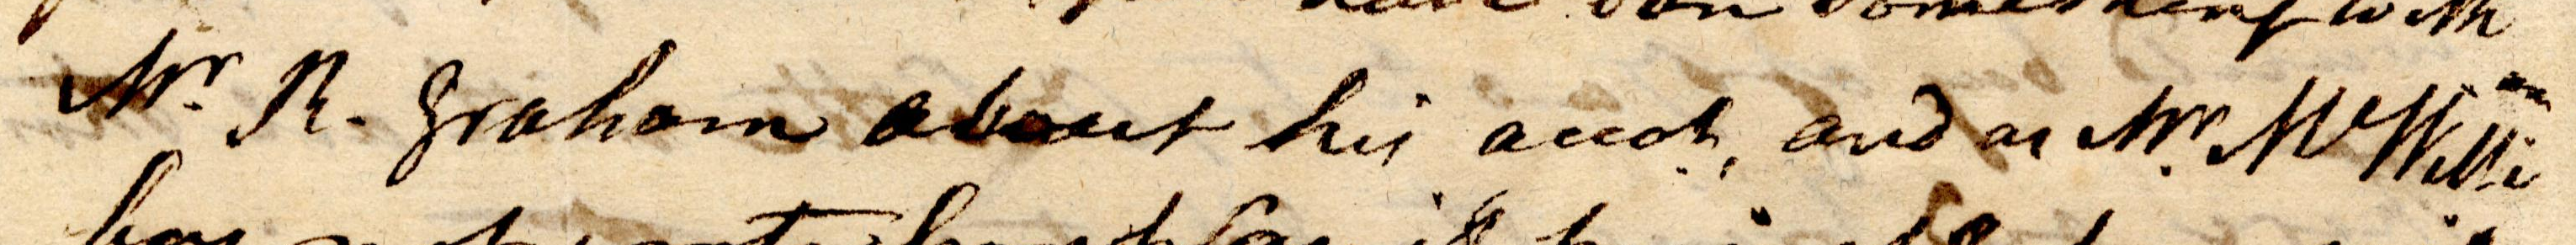M^r. R. Graham about his acco^t, and as M^r. M^c Willi
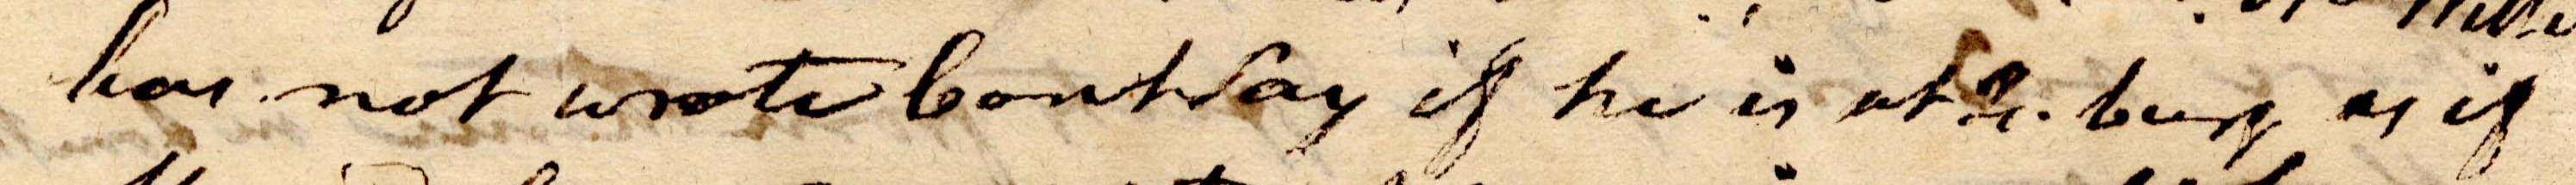has not wrote Cant say if he is ab^t. but as if
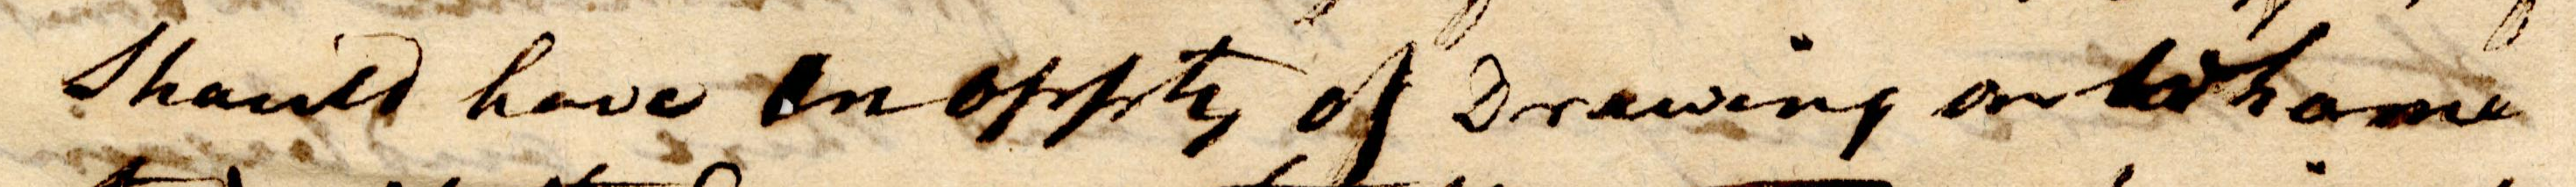should have an opp^ty of Drawing on what
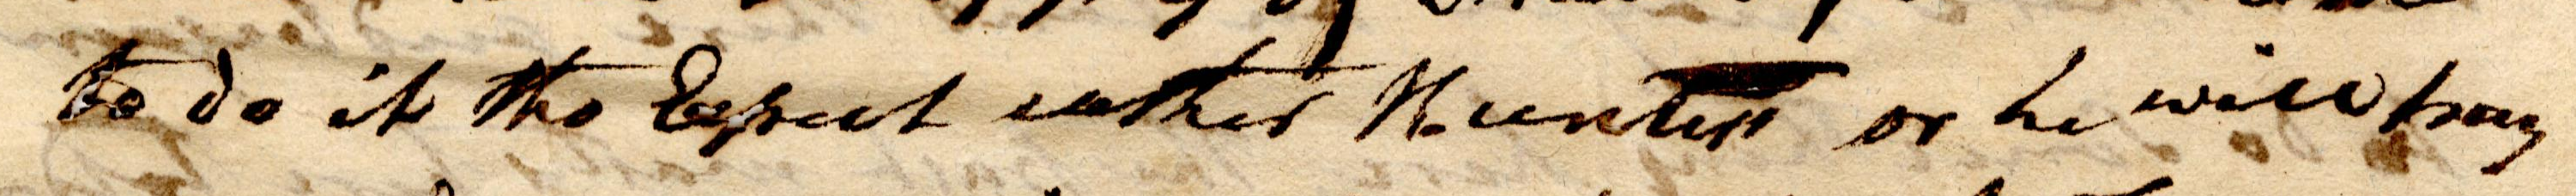to do it tho Expect rather N. unter or he will pay
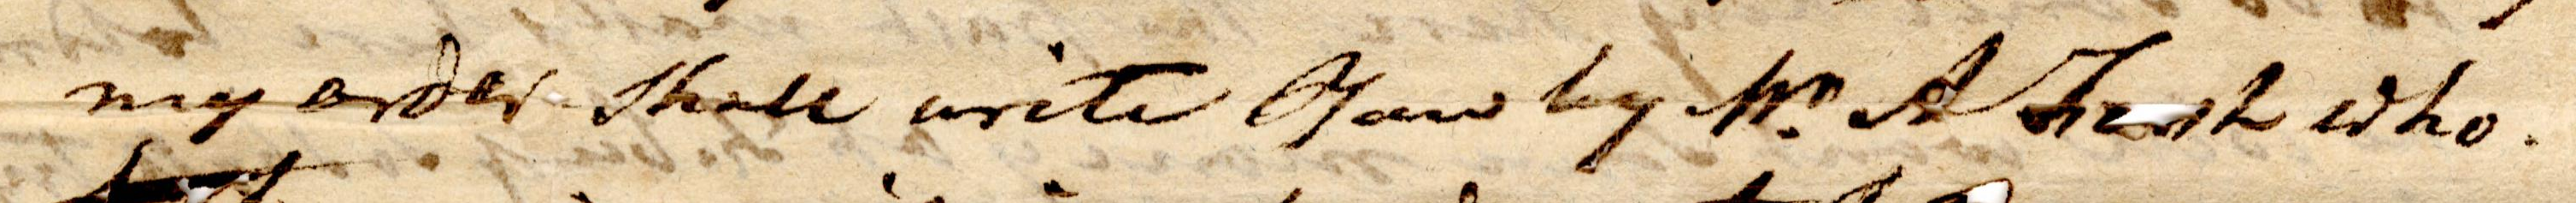my order shall write you by M^r. A First who
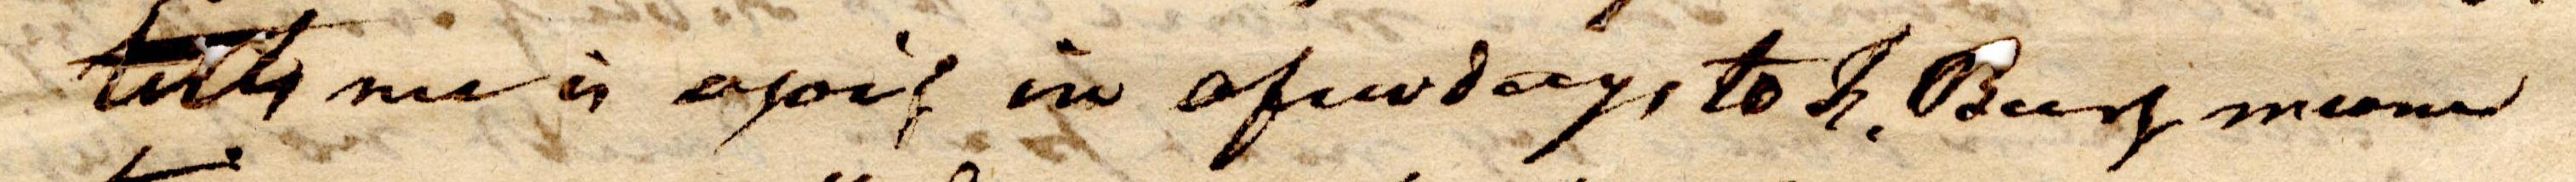tells me is agoing in a few days to F. Burg mean
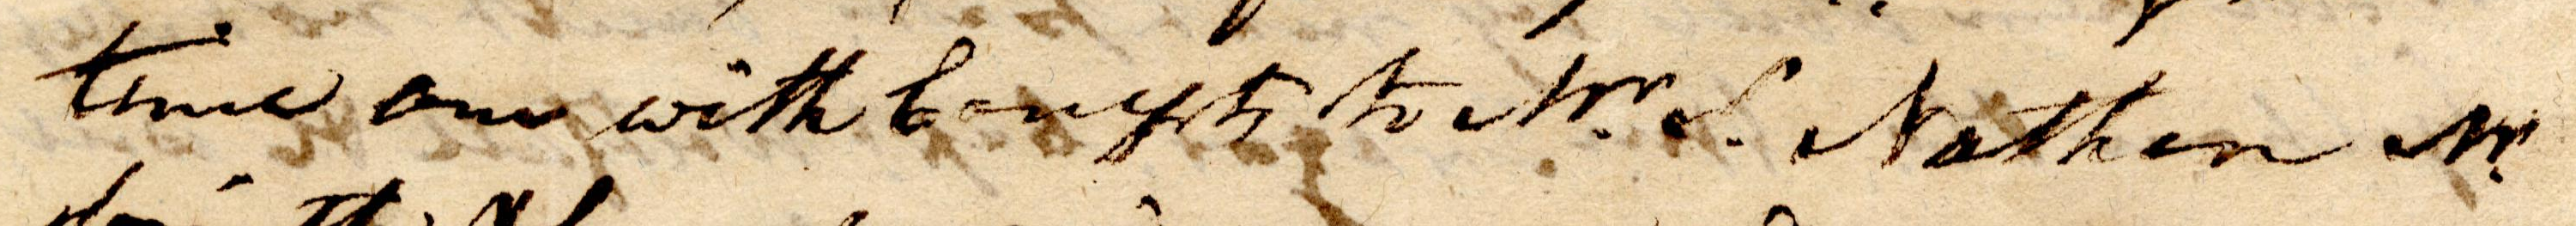time are with Compts to M^r. S Nathan M^r
